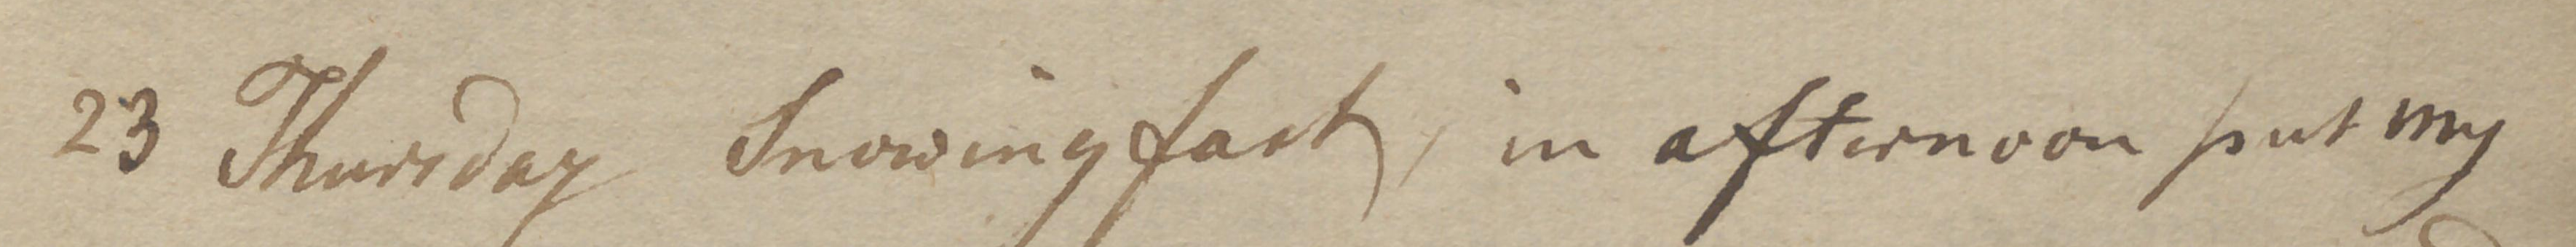23 Thursday Snowing fast in afternoon put my
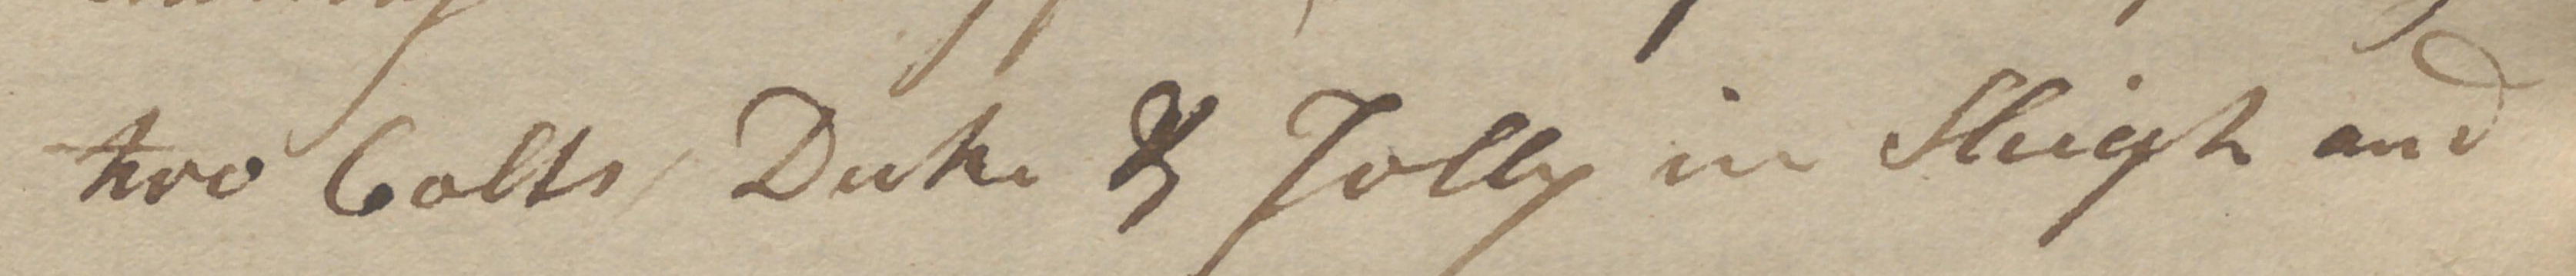hov Colts Duke & Jolly in Sleigh and
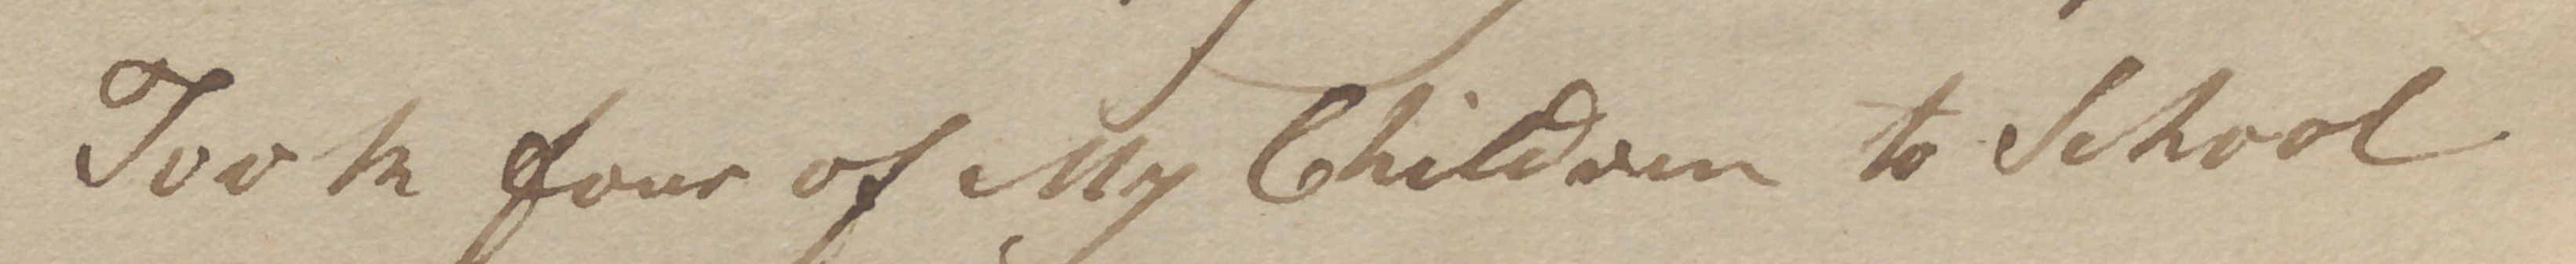Took four of My Children to School
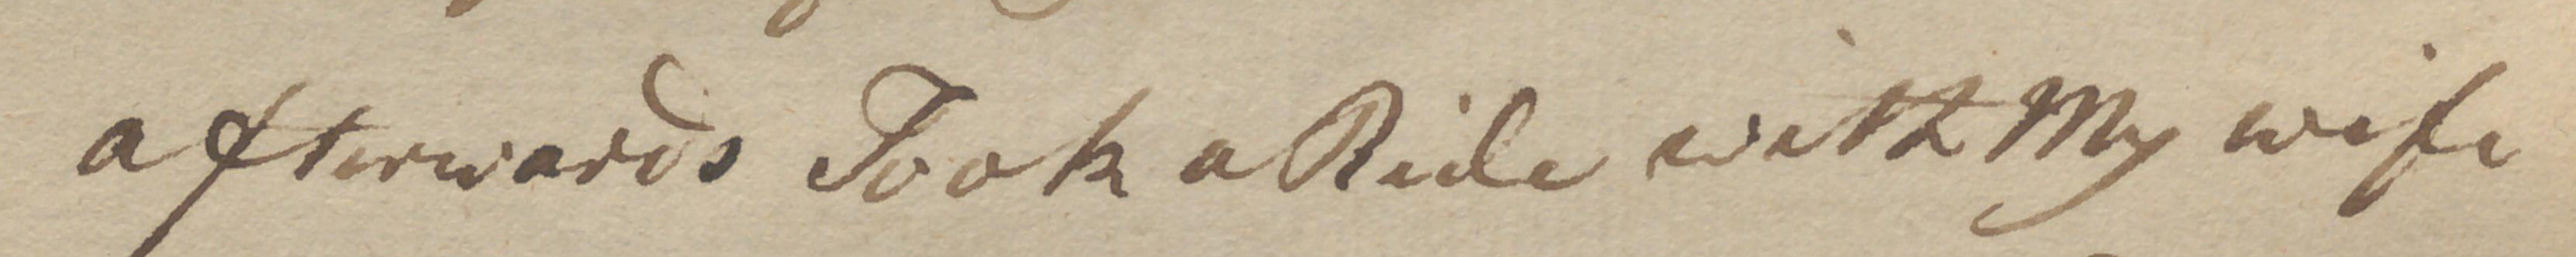afterwards Took a Rice with My wife
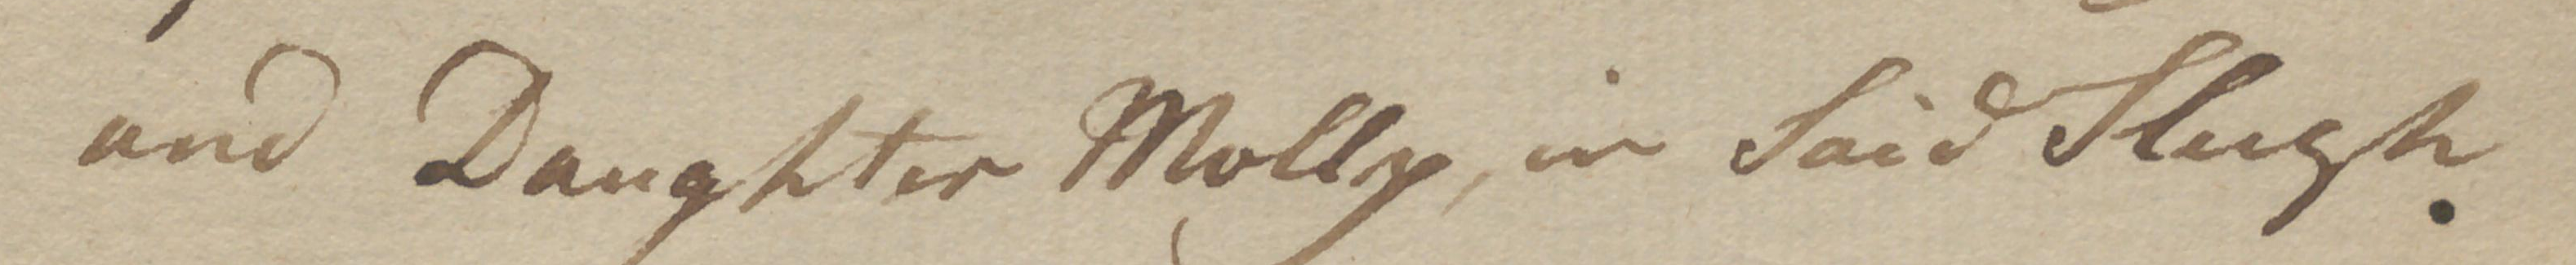and Daughter Molly, in Said Sleigh
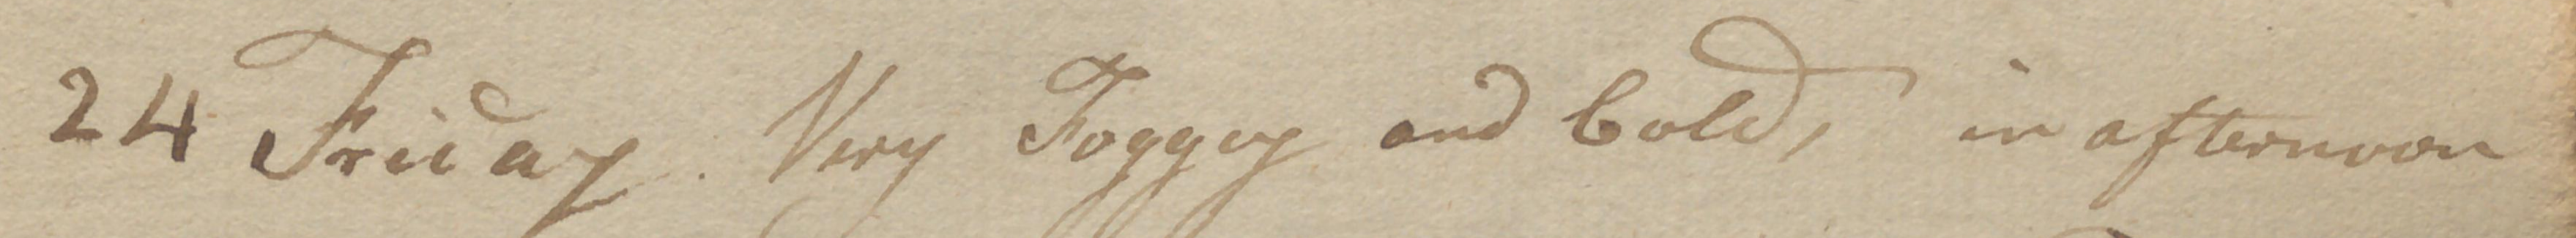24 Friday Very Foggey and Cold, in afternoon
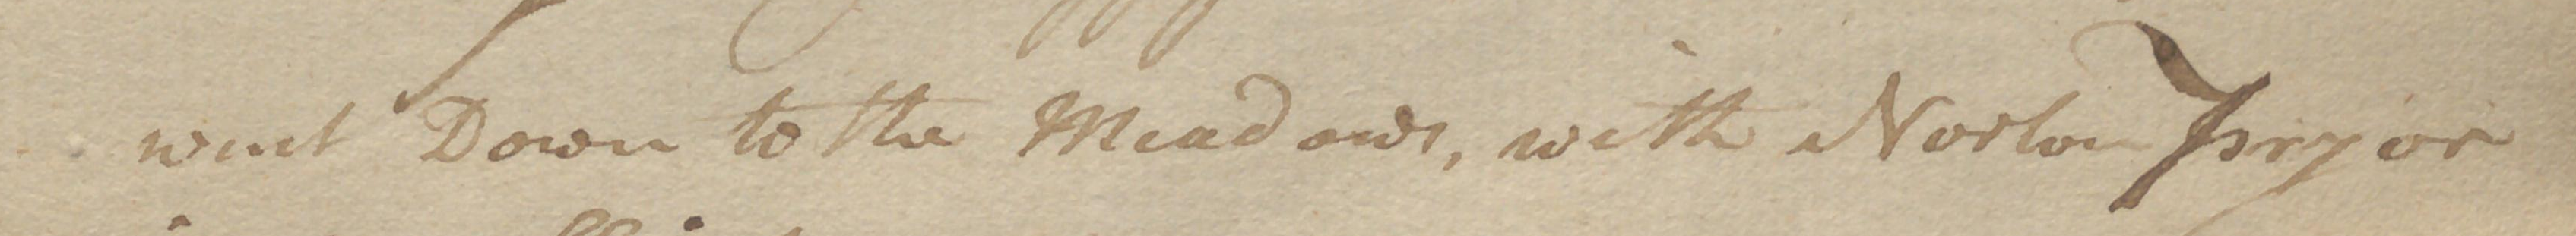went Down to the Meadows, with Norton pryor
